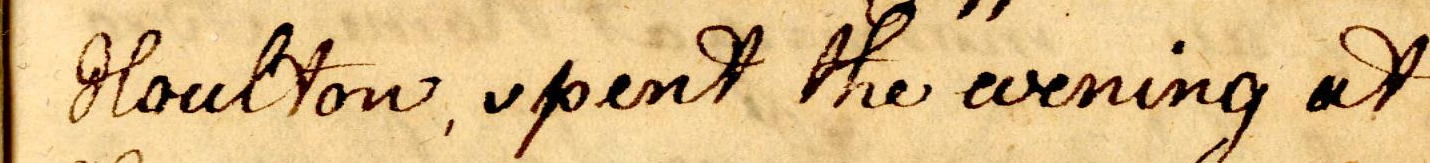Houlton, spent the evening at
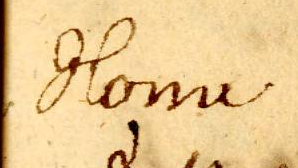Home -
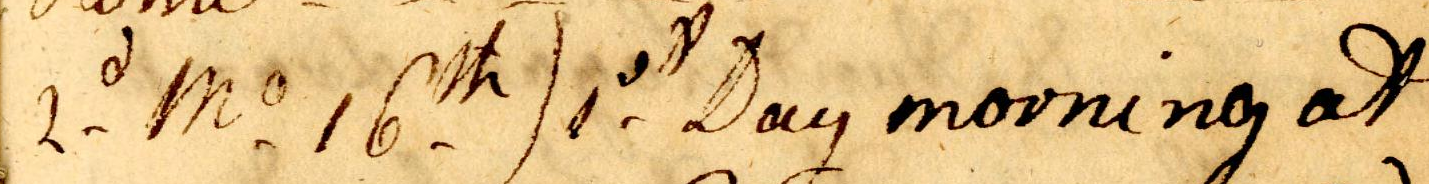2^d M^o 16 ^th ) 1^st Day morning at
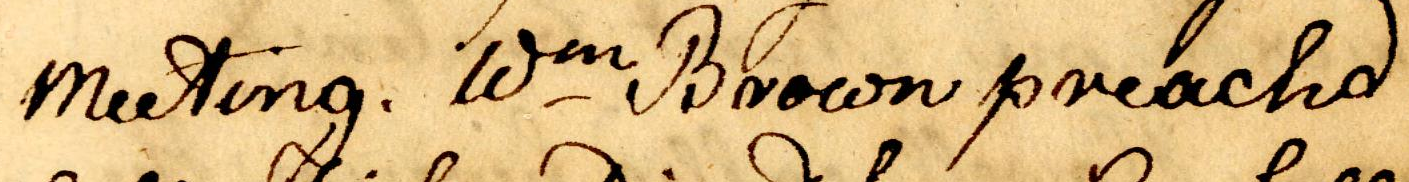Meeting. W^m Brown preachd
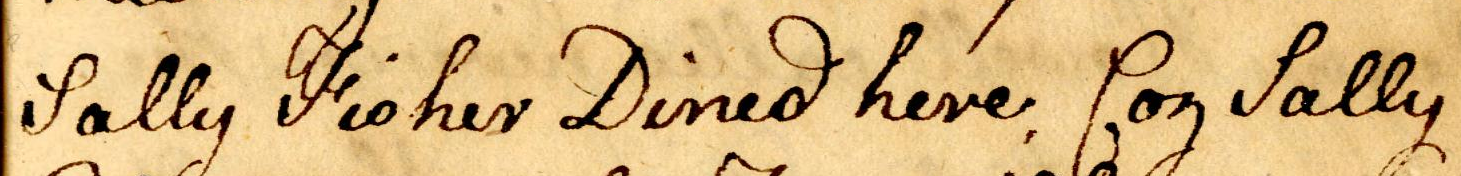Sally Fisher Dined here, Coz Sally
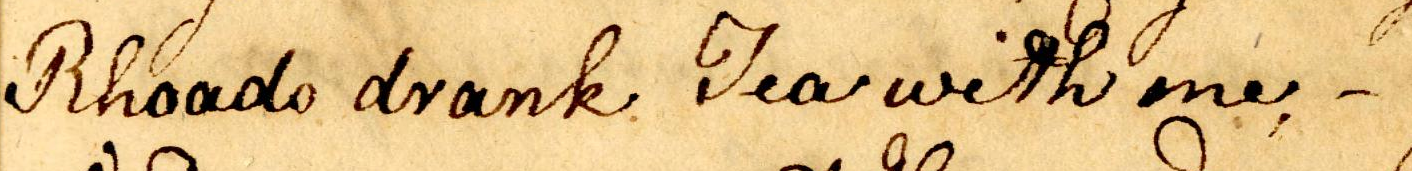Rhoads drank Tea with me, -
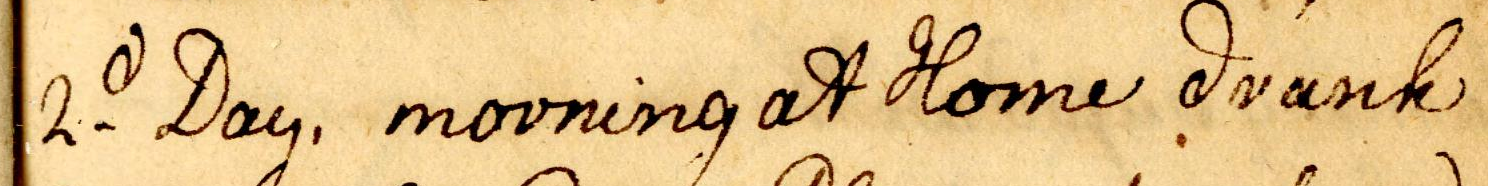2^d Day, morning at Home drank
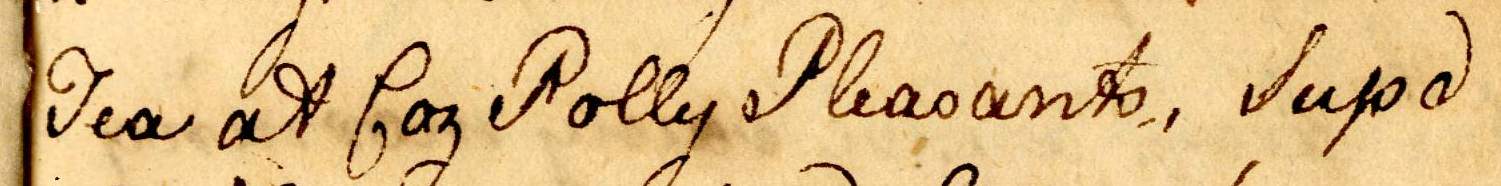Tea at Coz Polly Pleasants, Supd
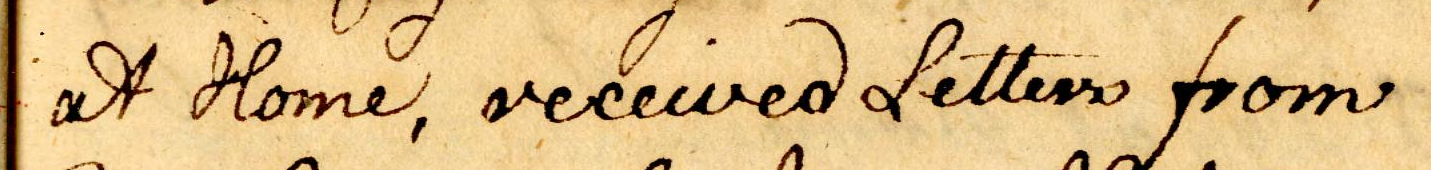at Home, received Letters from
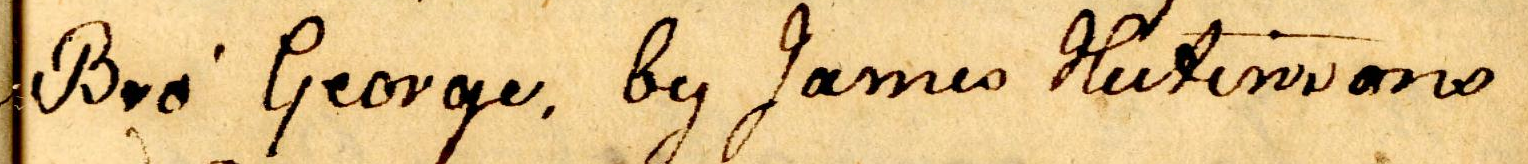Bro' George, by James Hutinisons
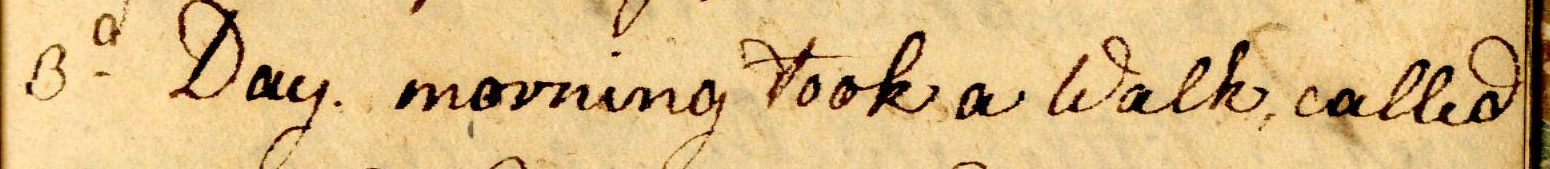3^d Day. morning took a Walk called
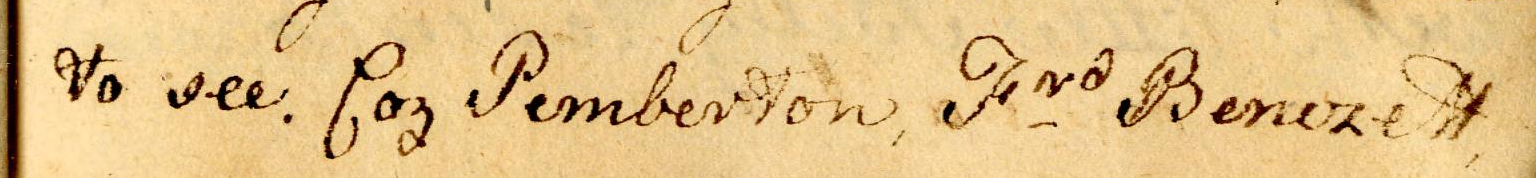to see. Coz Pemberton, F^rd Benezett
